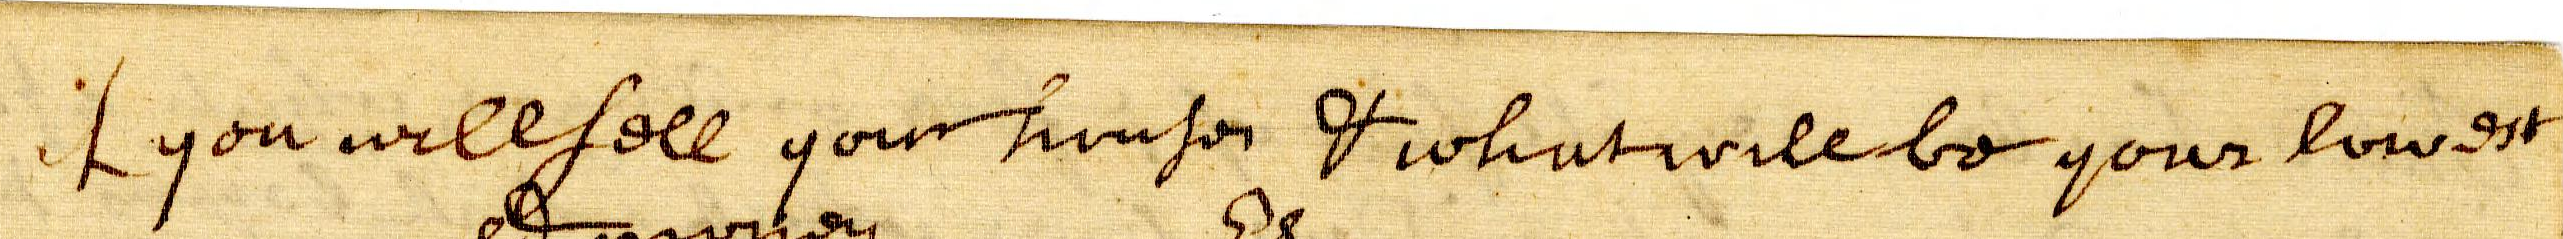if you will sell your houses & what will be your lowest
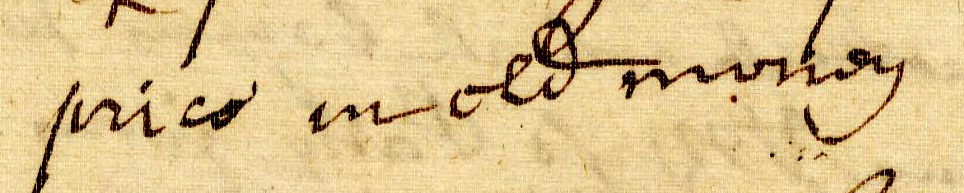price in old money
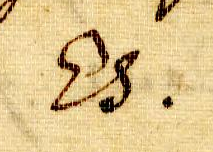ES.
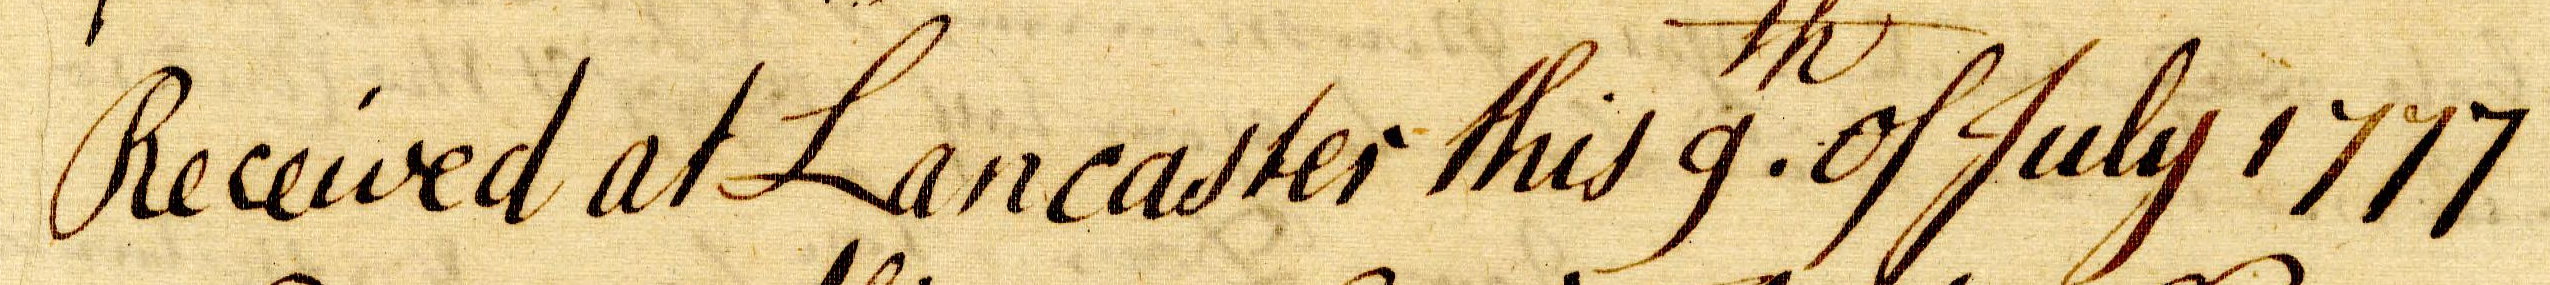Received at Lancaster this 9^th. of July 1777
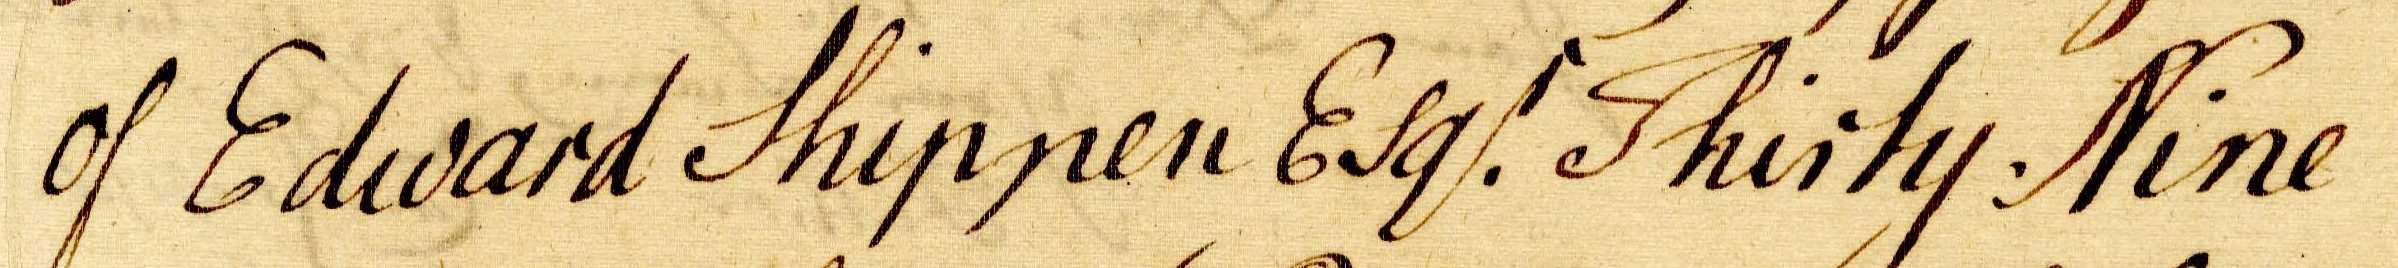of Edward Shippen Esq^r. Thirty Nine
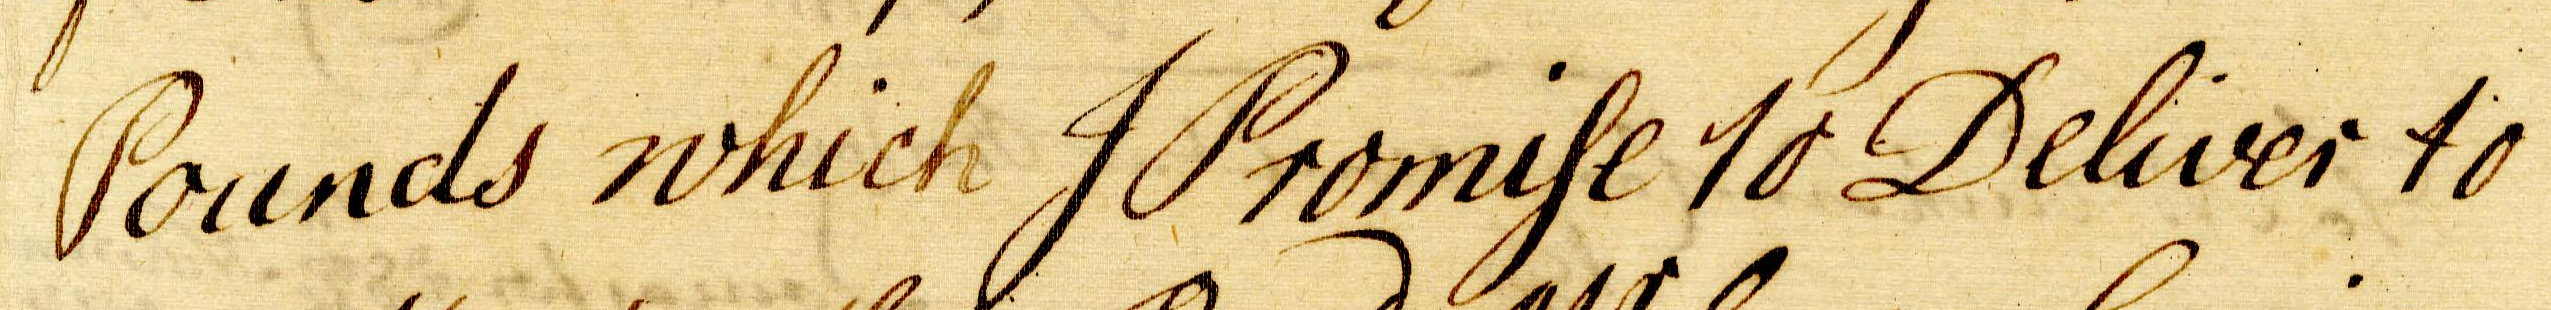Pounds which I Promise to Deliver to
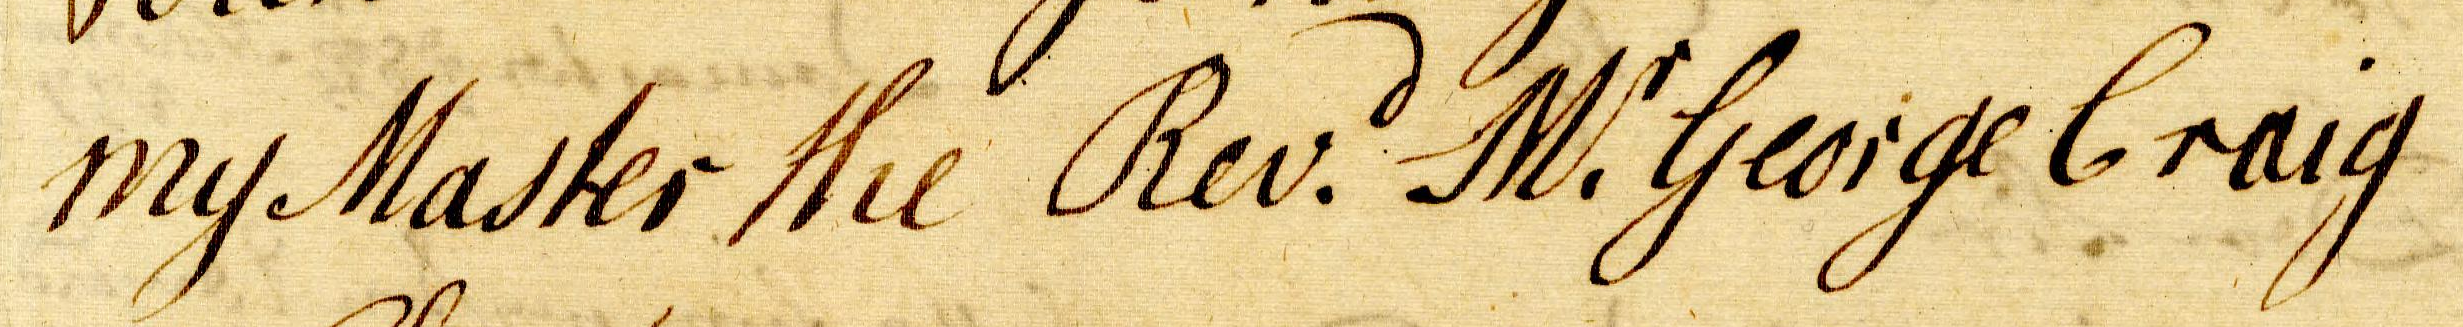my Master the Rev^d. M^r. George Craig
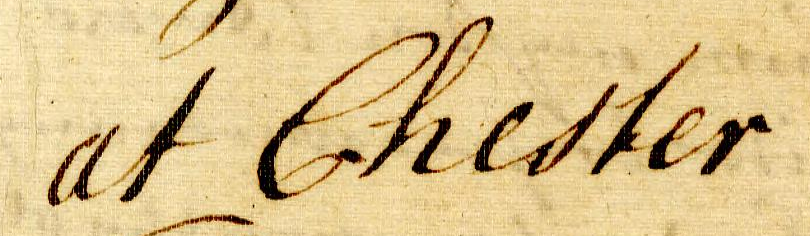at Chester
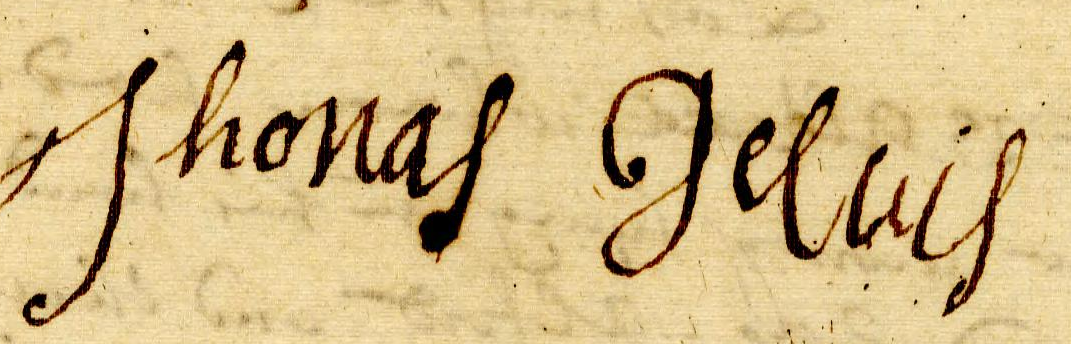Thomas Delius
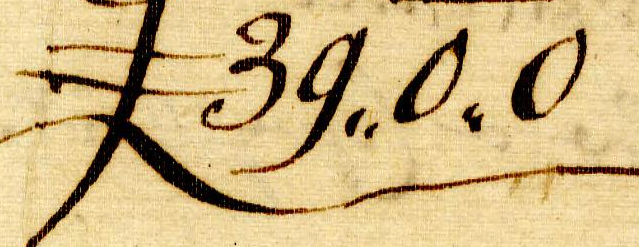£39..0..0
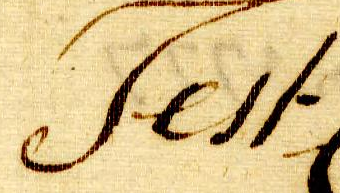Test
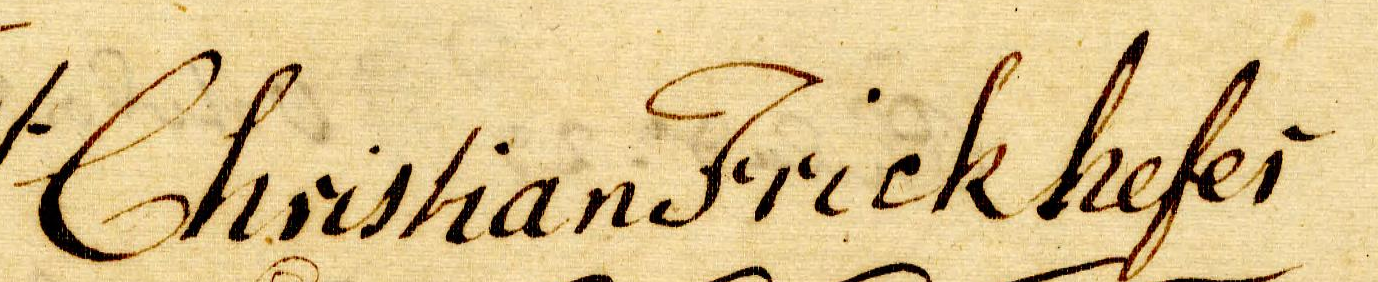Christian Frickhefer
